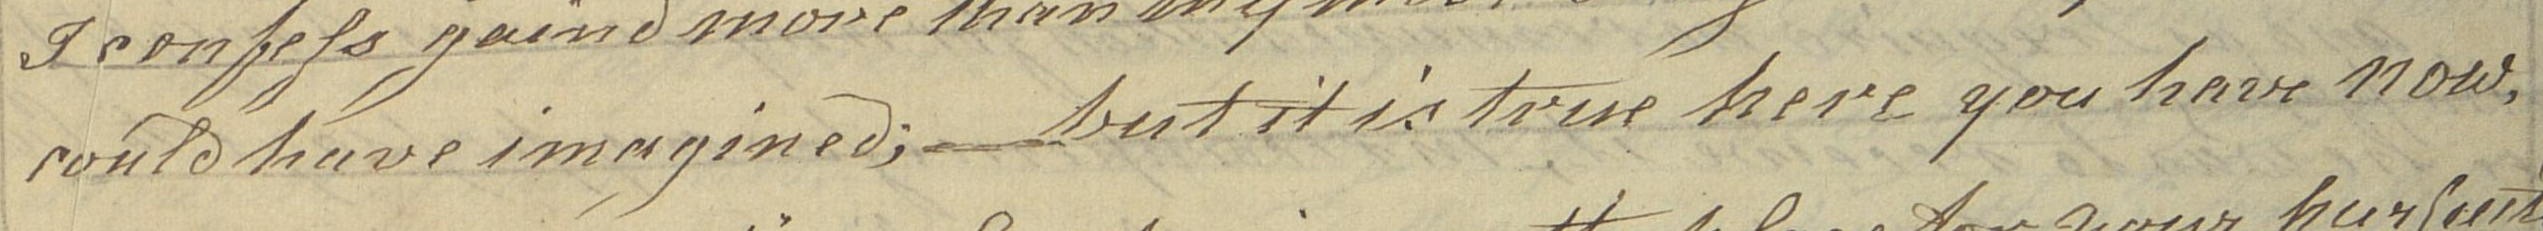could have imagined; but it is true here you have now,
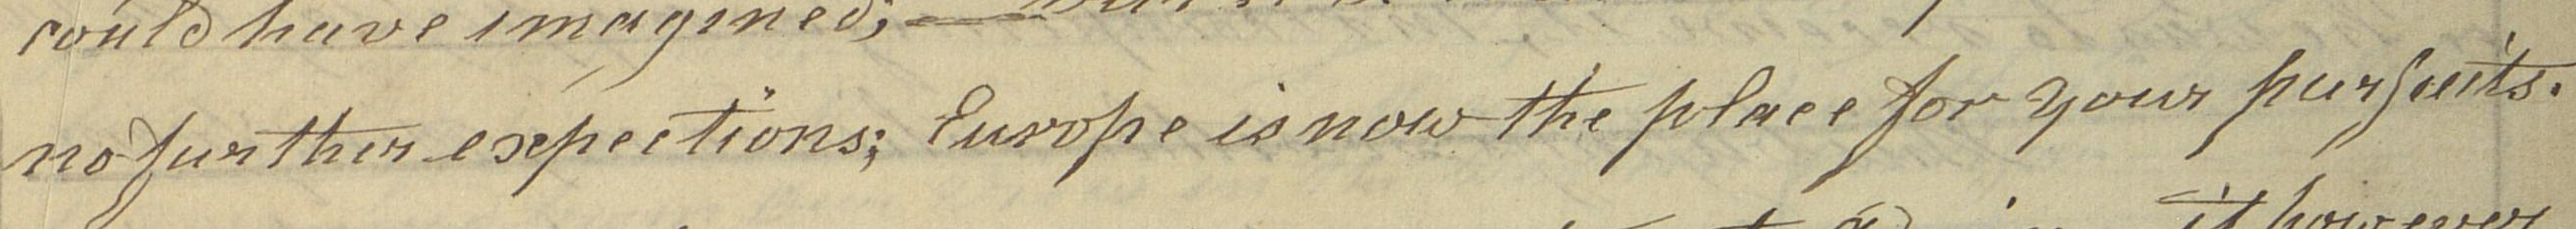no further exepections, Europe is now the place for your pursuits
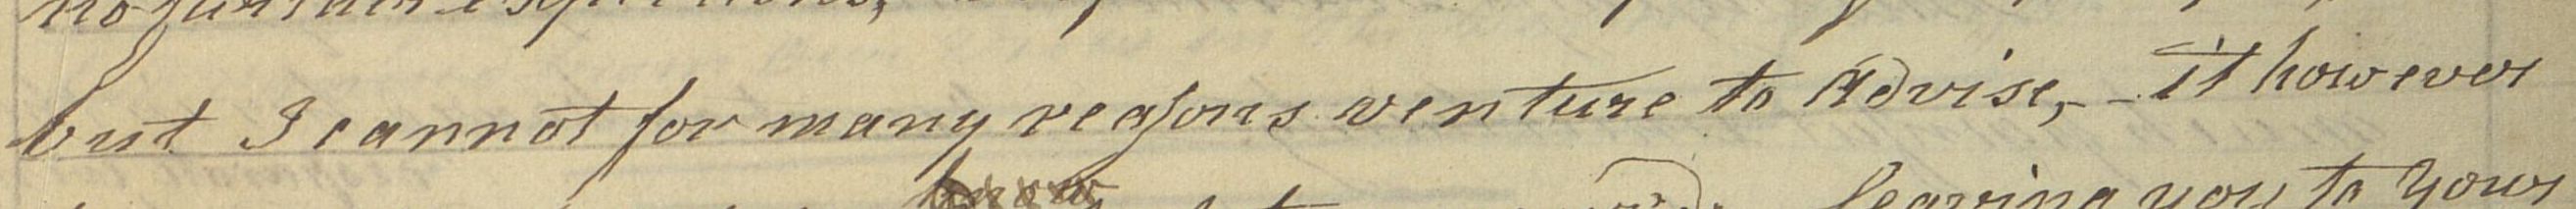best I cannot for many reasons venture to Advise, it however
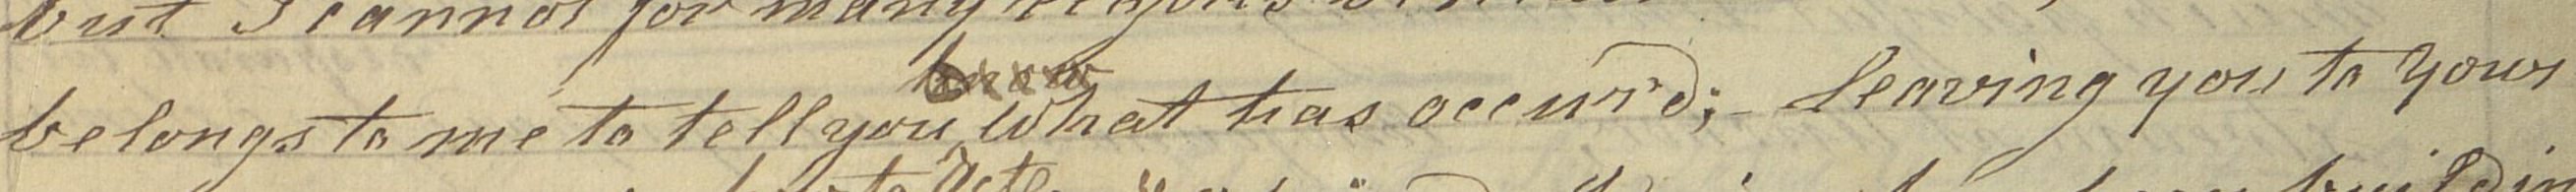belongs to me to tell you ^ what has occur'd; leaving you to your
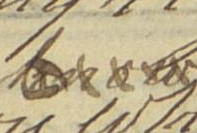know
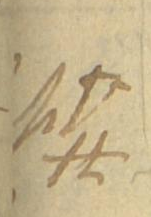-pt^r
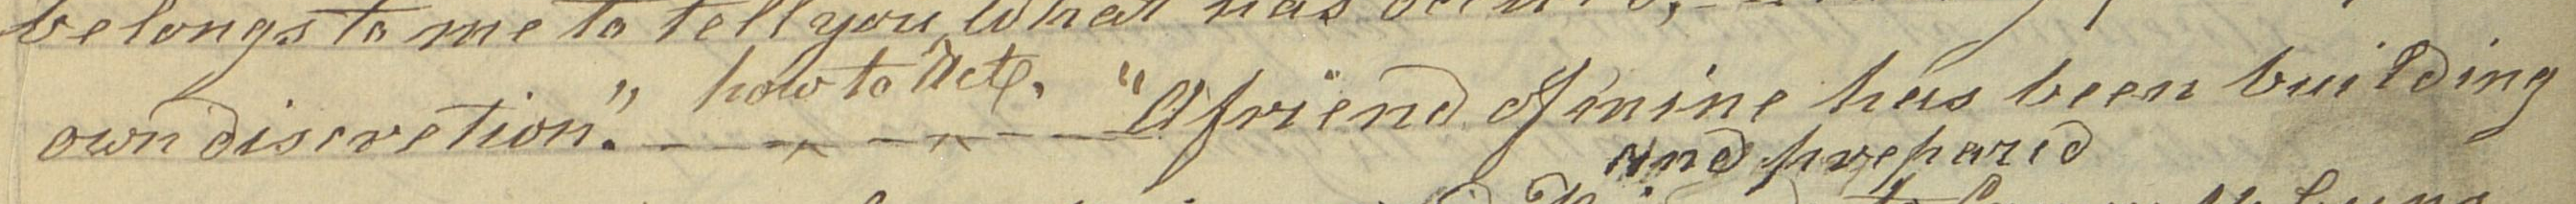own discretion." ^ ^ A friend of mine has been building
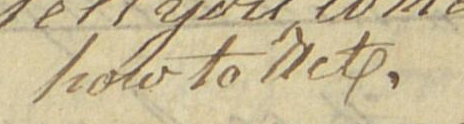how to Act,
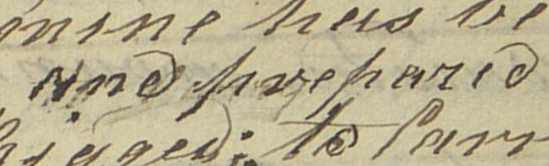and prepared
